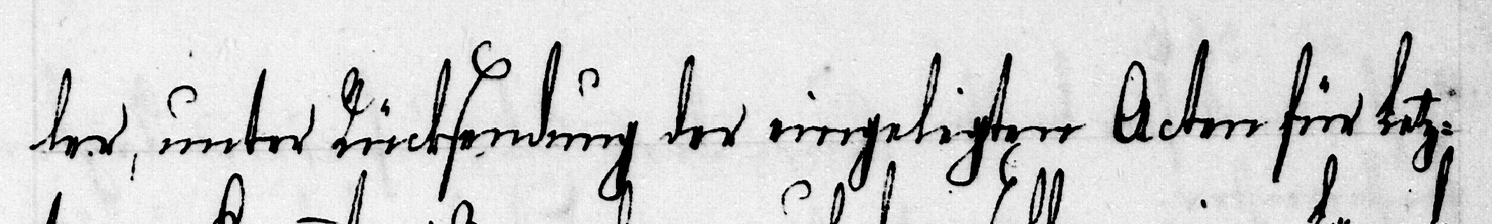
ler, unter Rücksendung der eingelegten Acten für Letz¬
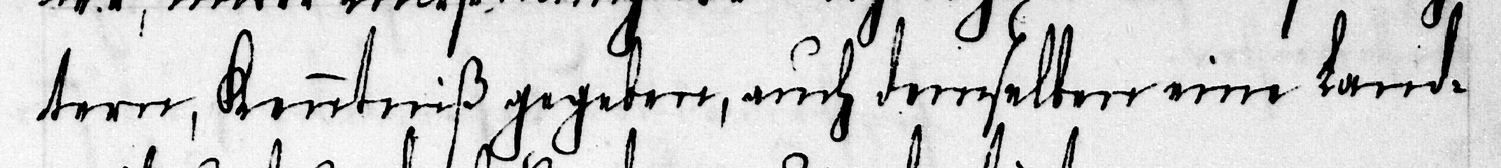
tern, Kenntniß gegeben, auch demselben eine Land¬
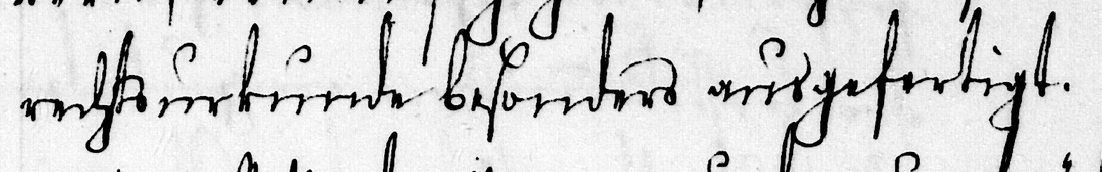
rechtsurkunde besonders ausgefertigt.
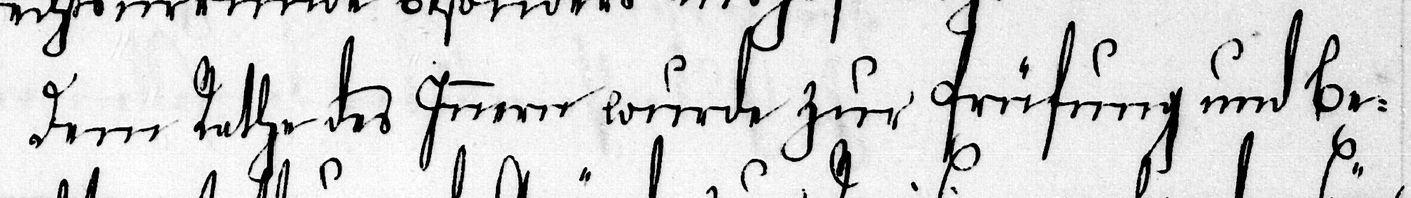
Dem Rathe des Innern wurde zur Prüfung und Be¬
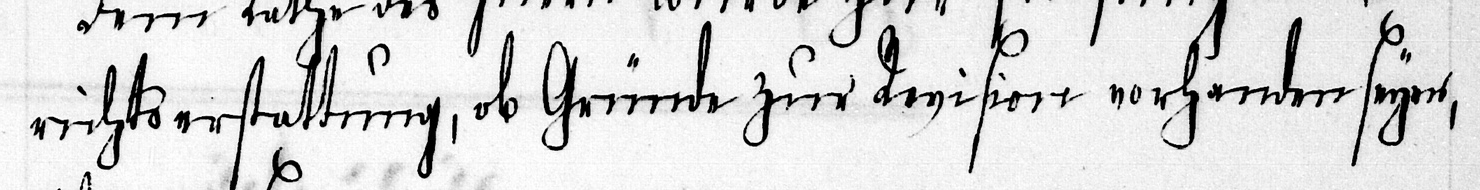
richtserstattung, ob Gründe zur Revision vorhanden seyen,
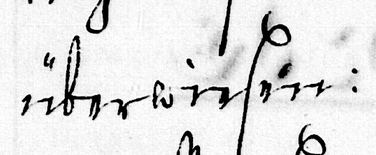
überwiesen:
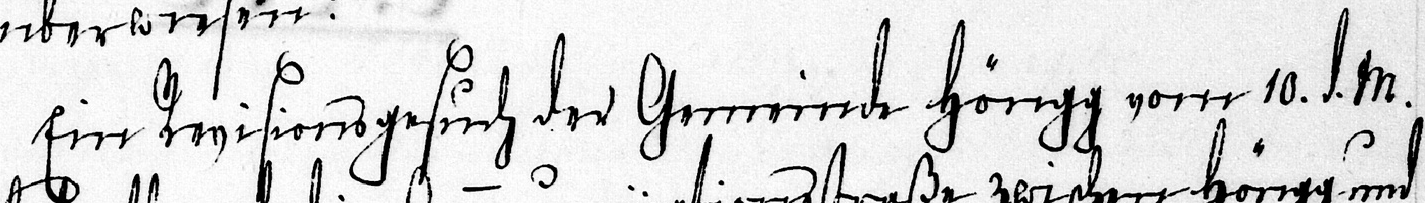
Ein Revisionsgesuch der Gemeinde Höngg vom 10. d. M.
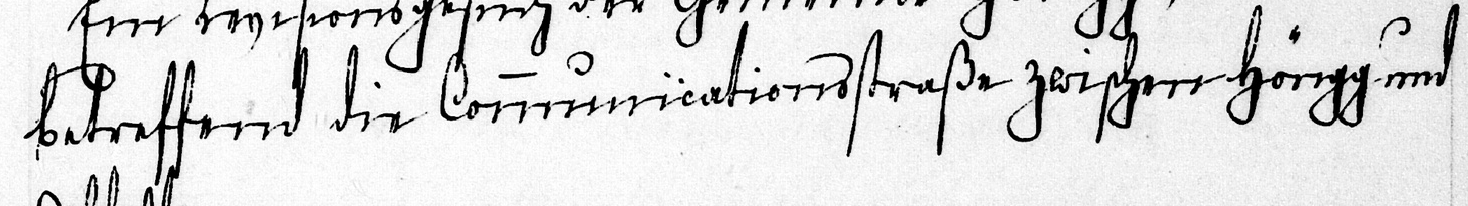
betreffend die Communicationsstraße zwischen Höngg und
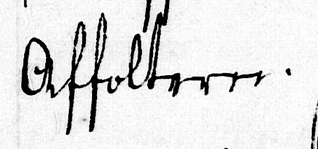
Affoltern.
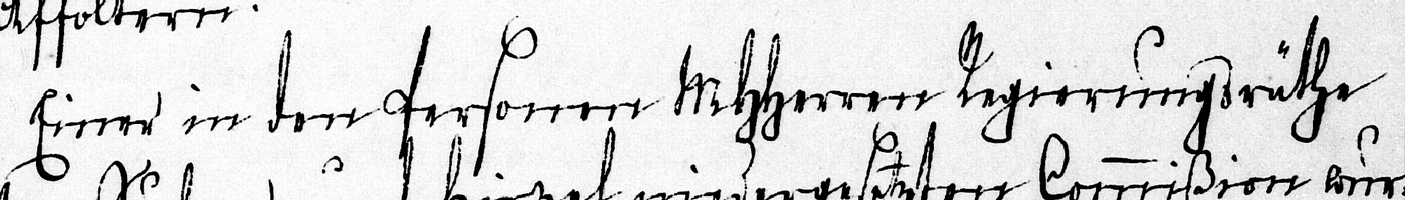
Einer in den Personen MHHerren Regierungsräthe
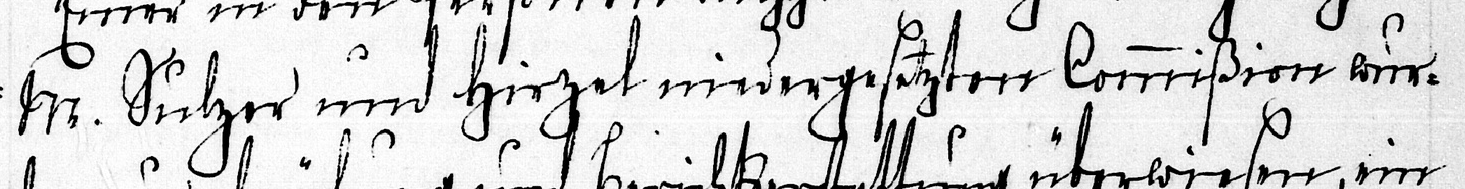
M. Sulzer und Hirzel niedergesetzten Commißion wur¬
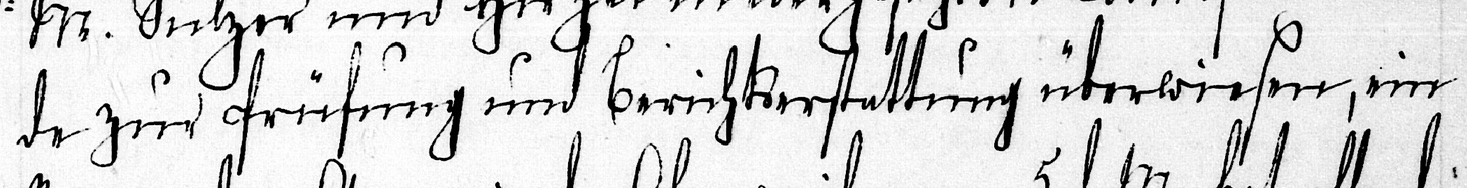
de zur Prüfung und Berichtserstattung überwiesen, ein
